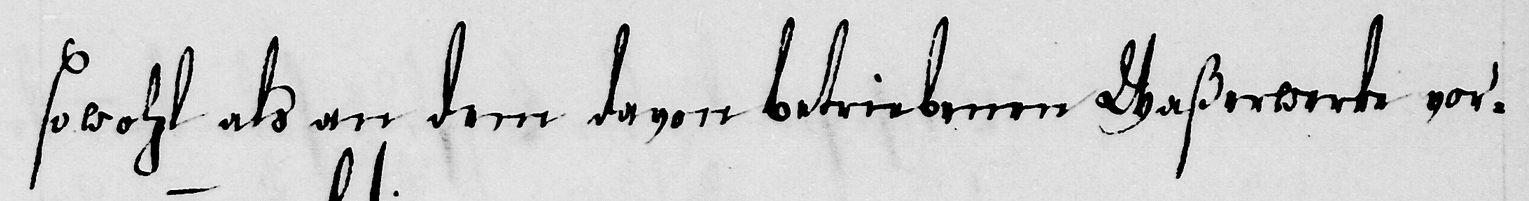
sowohl als an dem davon betriebenen Waßerwerke vor¬
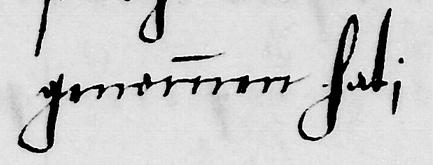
genommen hat;
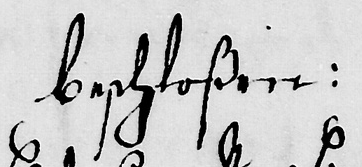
beschloßen:
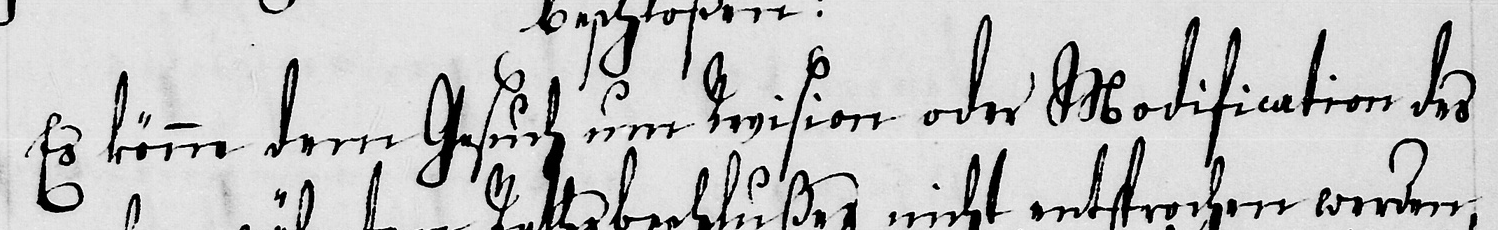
Es könne dem Gesuch um Revision oder Modification des
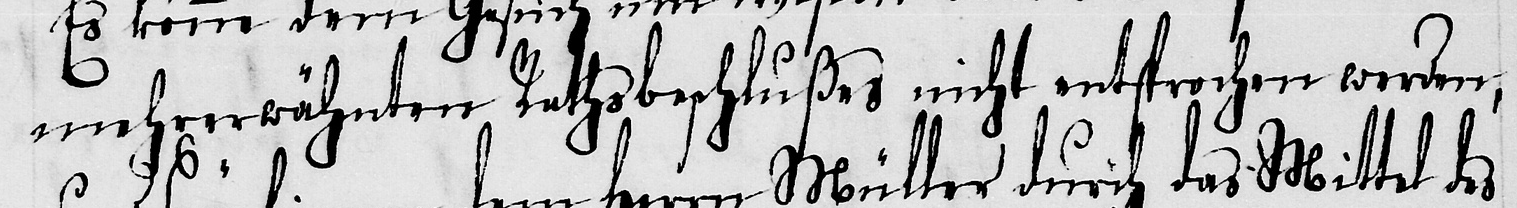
mehrerwähnten Rathsbeschlußes nicht entsprochen werden,
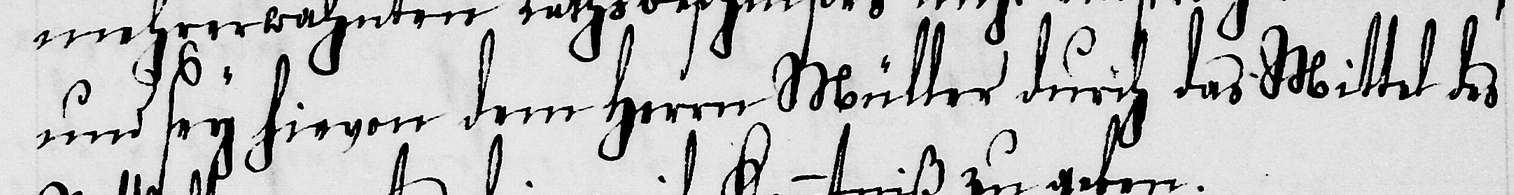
und sey hievon dem Herrn Müller durch das Mittel des
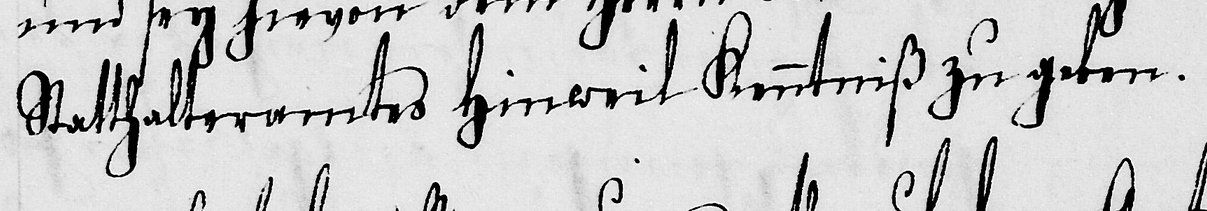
Statthalteramtes Hinweil Kenntniß zu gegeben.
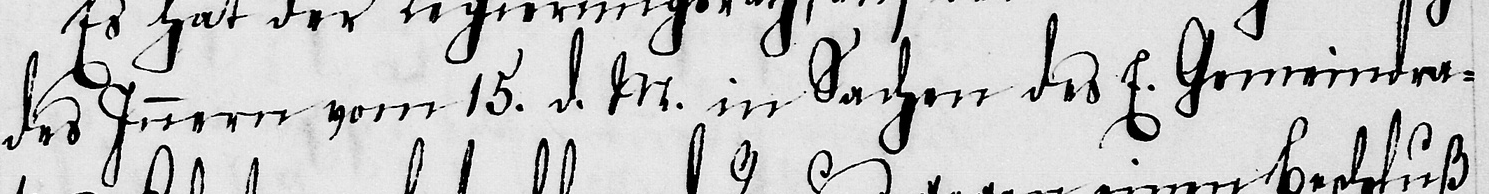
des Innern vom 15. d. M. in Sachen des E. Gemeindra¬
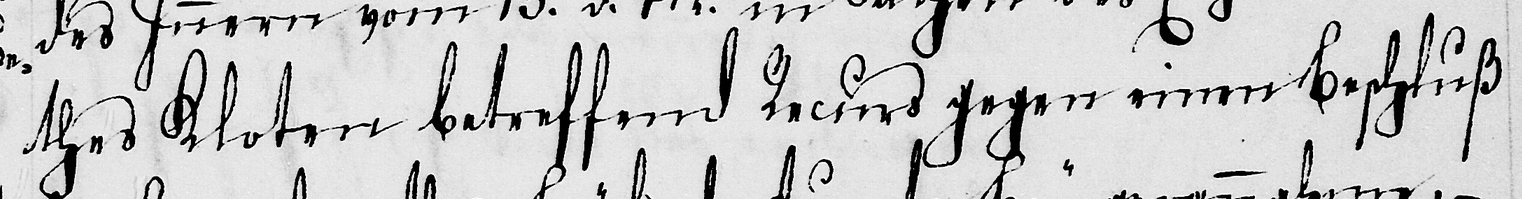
thes Kloten betreffend Recurs gegen einen Beschluß
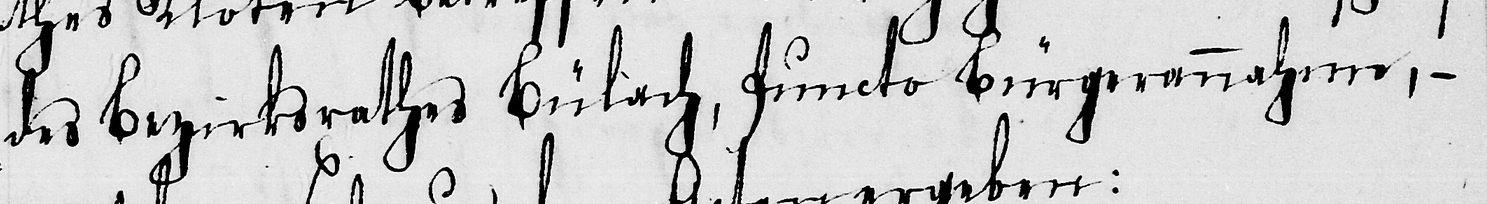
des Bezirksrathes Bülach, Puncto Bürgerannahme, –
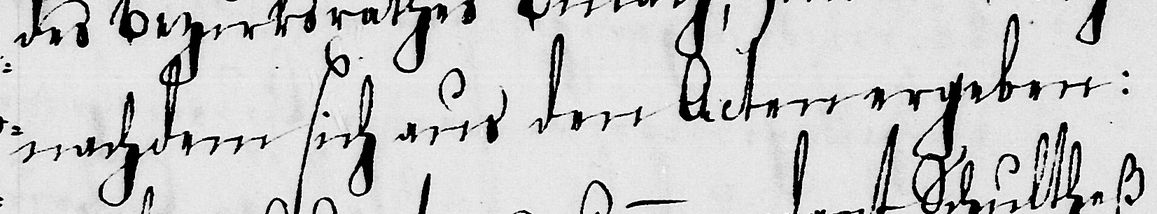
nachdem sich aus den Acten ergeben:
